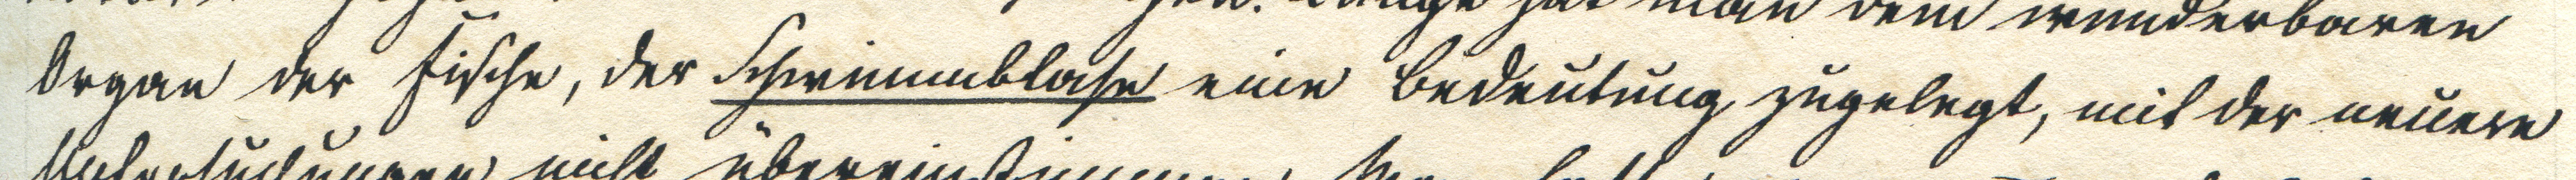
Organ der Fische, der Schwimmblase eine Bedeutung zugelegt, mit der neuere
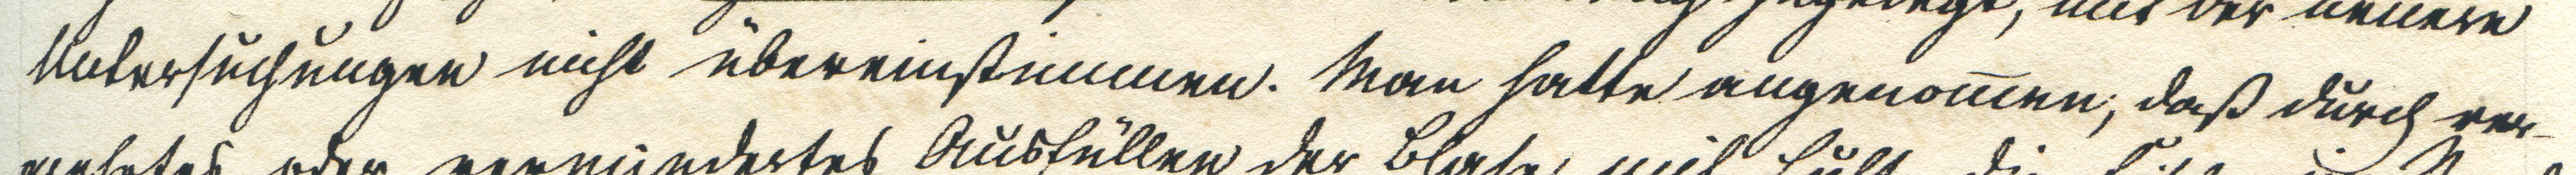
Untersuchungen nicht übereinstimmen. Man hatte angenom̃en, daß durch ver-
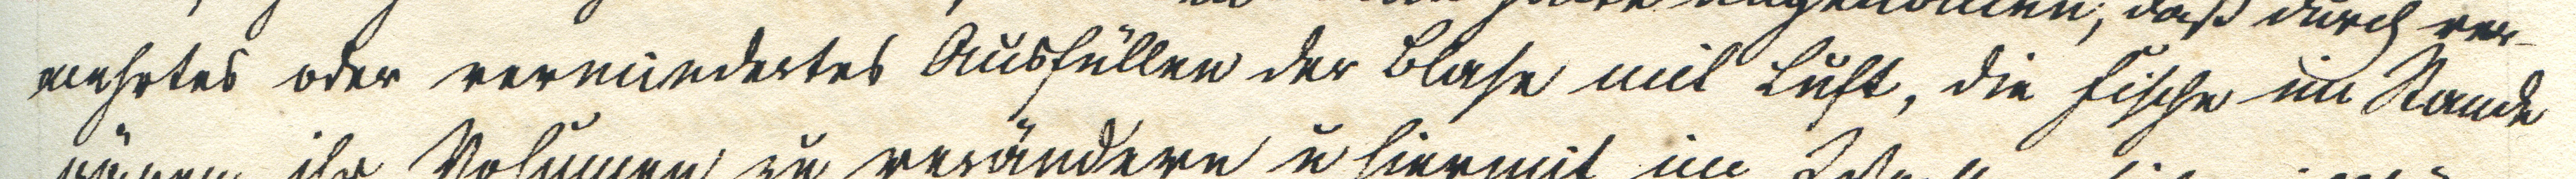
mehrtes oder vermindertes Ausfüllen der Blase mit Luft, die Fische im Stande
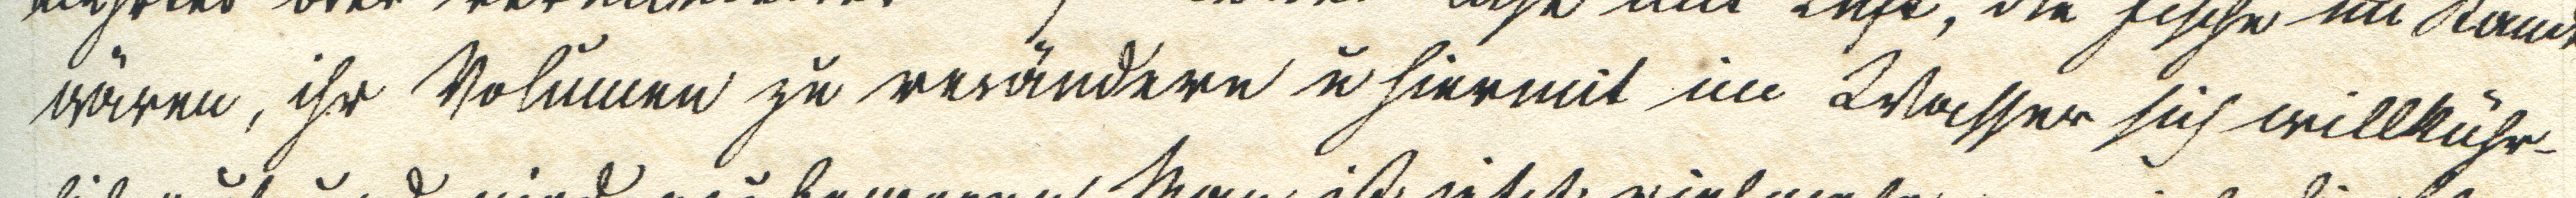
wären, ihr Volumen zu verändern u hiermit im Wasser sich willkühr-
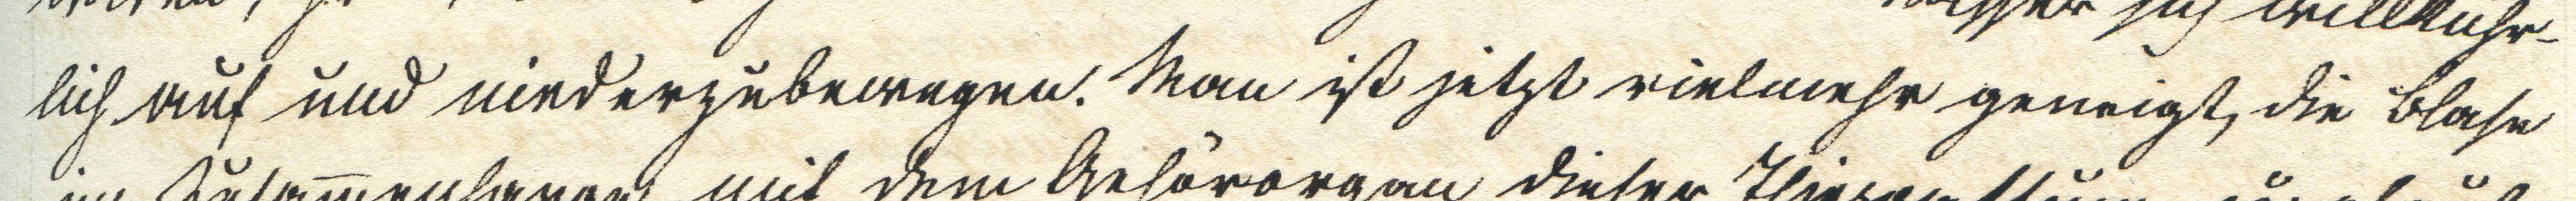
lich auf und niederzubewegen. Man ist jetzt vielmehr geneigt, die Blase
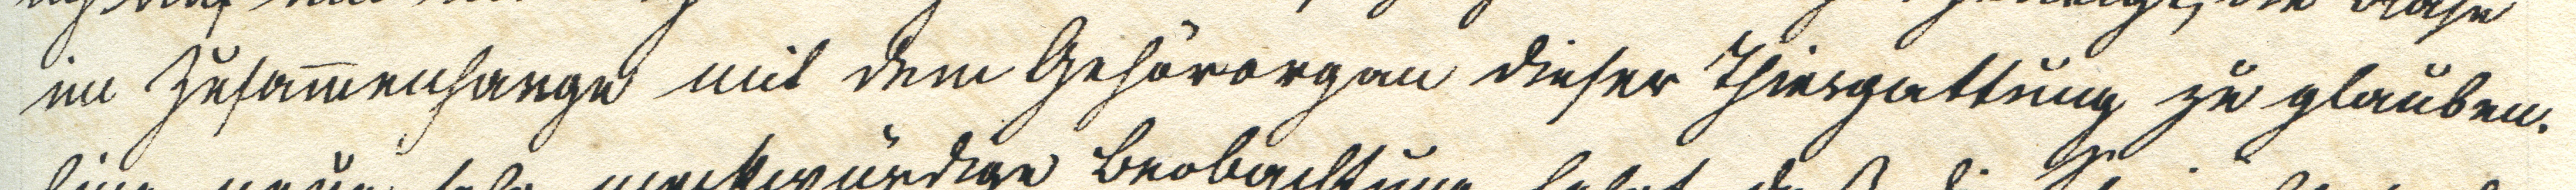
im Zusam̃enhange mit dem Gehörorgan dieser Thiergattung zu glauben.
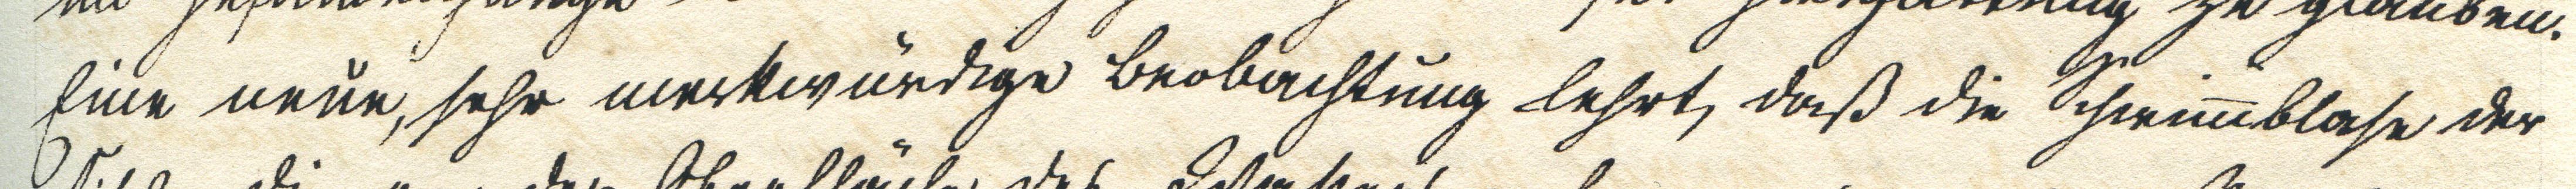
Eine neue, sehr merkwürdige Beobachtung lehrt, daß die Schwim̃blase der
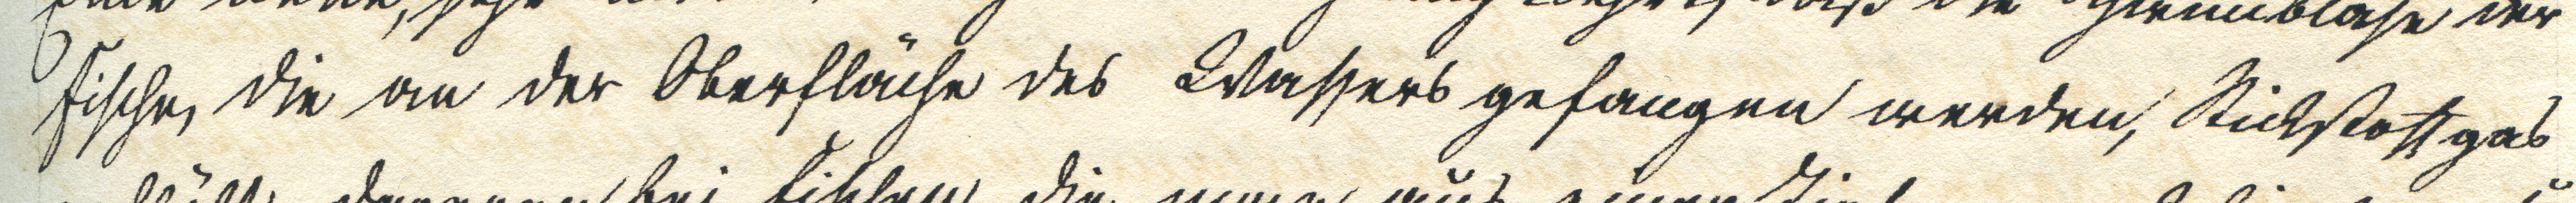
Fische, die an der Oberfläche des Wassers gefangen werden, Stickstoffgas
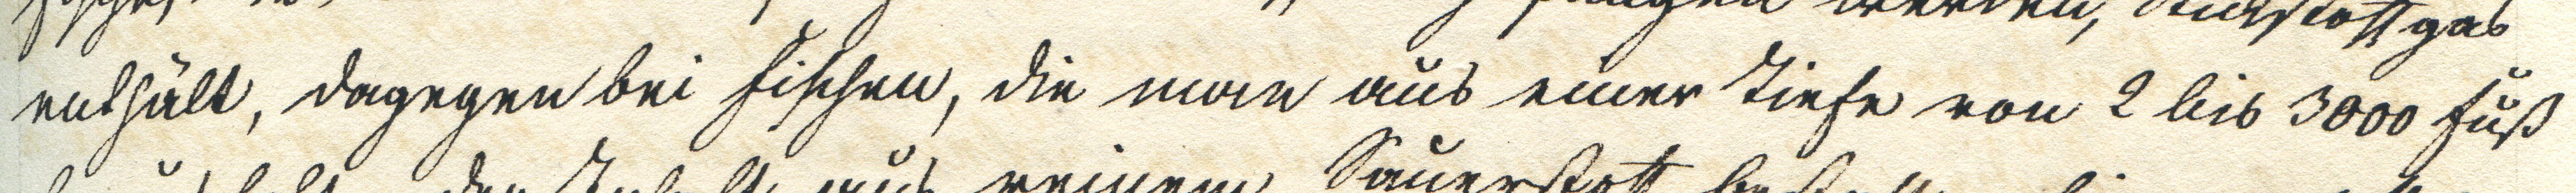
enthält, dagegen bei Fischen, die man aus einer Tiefe von 2 bis 3000 Fuß
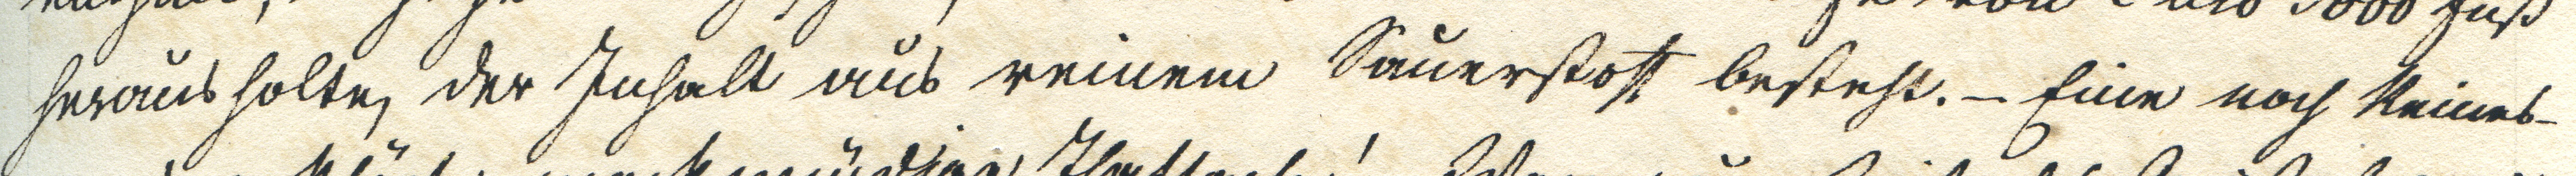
heraus holte, der Inhalt aus reinem Sauerstoff besteht. – Eine noch keines-
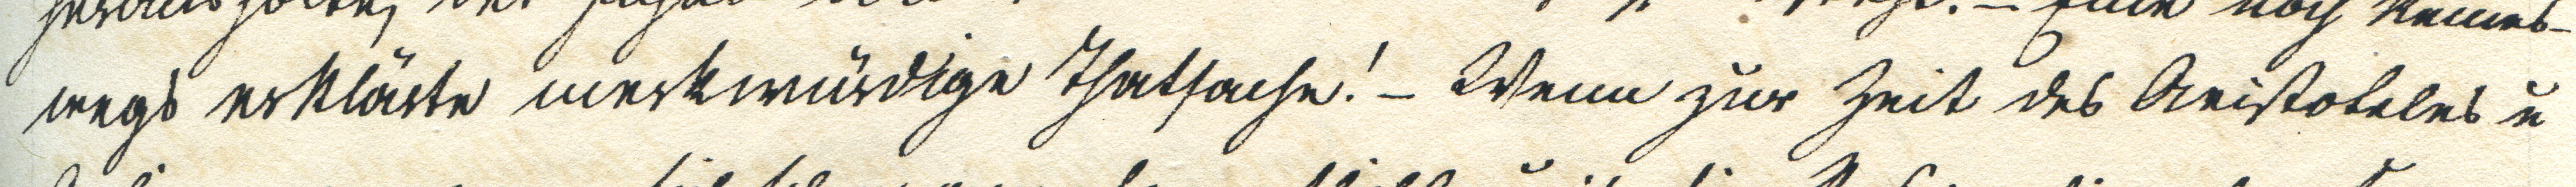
wegs erklärte merkwürdige Thatsache! – Wenn zur Zeit des Aristoteles u
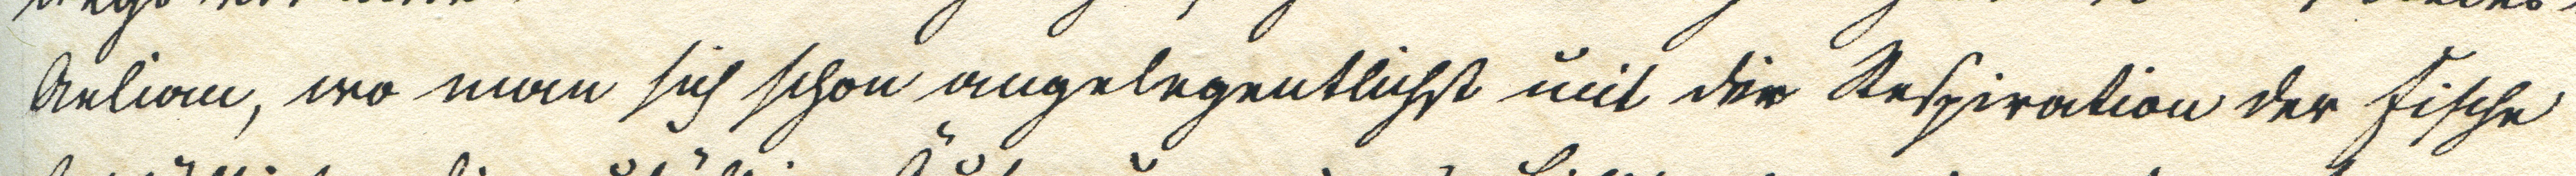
Aelian, wo man sich schon angelegentlichst mit dirder Respiration der Fische
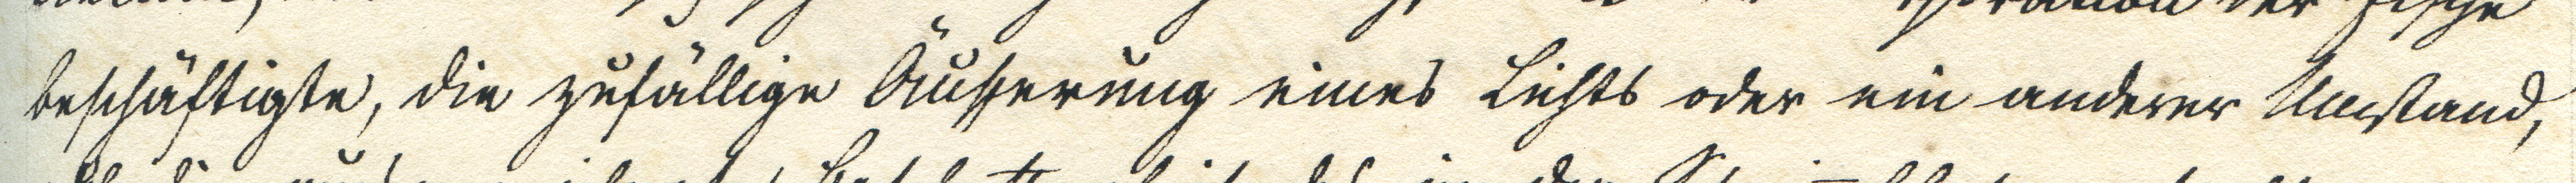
beschäftigte, die zufällige Äusserung eines Lichts, oder ein anderer Umstand,
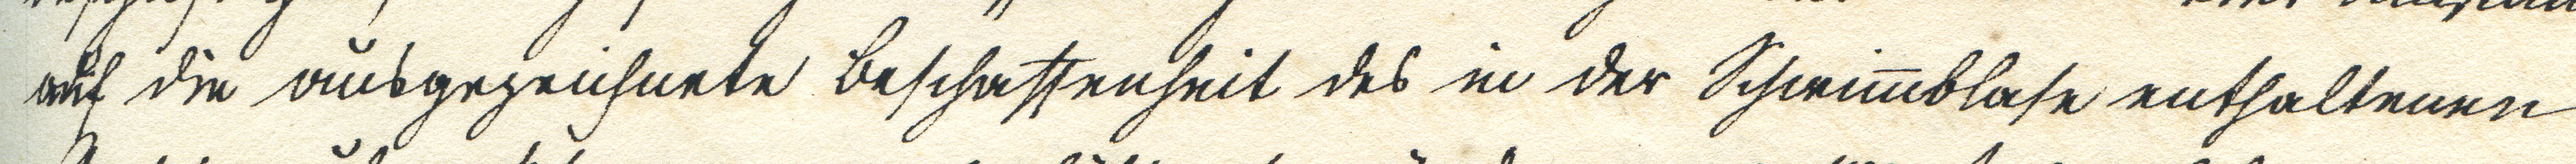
auf die ausgezeichnete Beschaffenheit des in der Schwim̃blase enthaltenen
